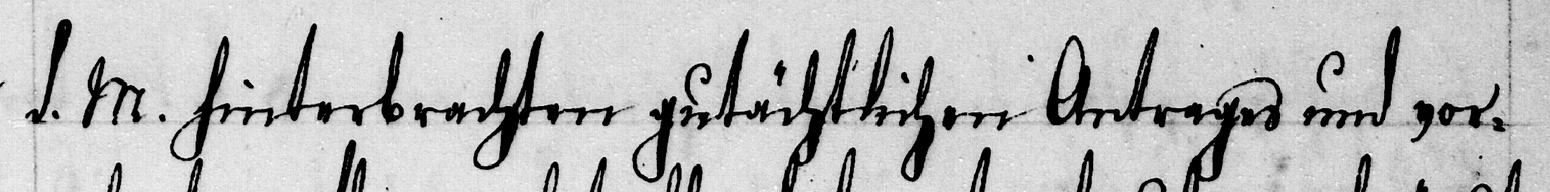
d. M. hinterbrachten gutächtlichen Antrages und vor¬
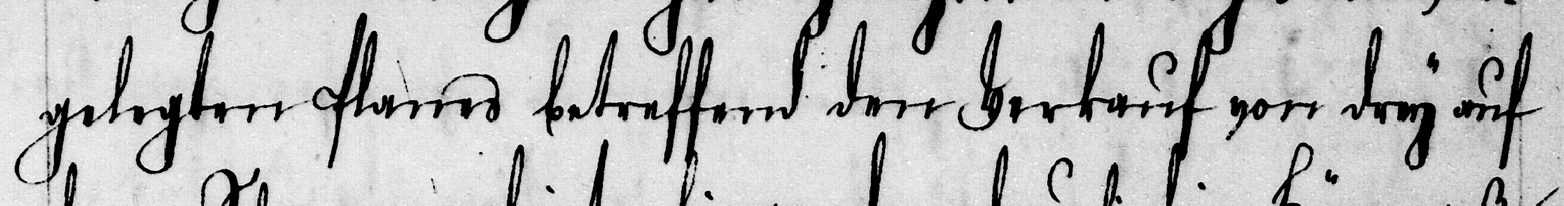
gelegten Planes betreffend den Verkauf von drey auf
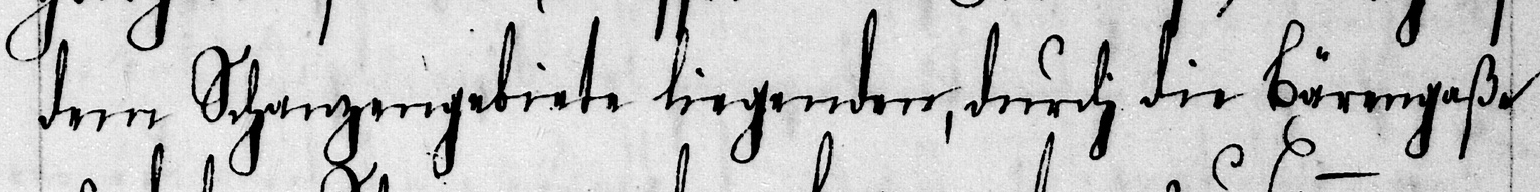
dem Schanzengebiete liegenden, durch die Bärengaße
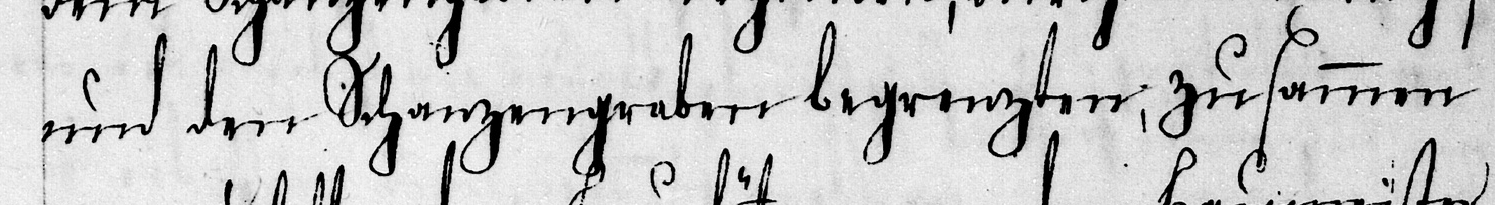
und den Schanzengraben begrenzten, zusammen
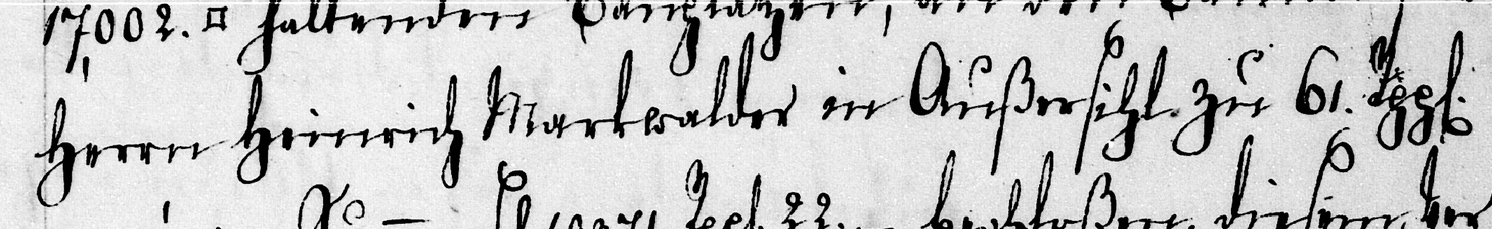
Herrn Heinrich Markwalder in Außersihl zu 61. Rp¬
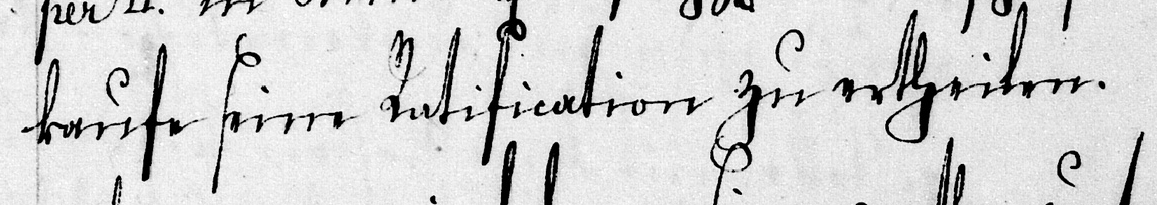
kaufe seine Ratification zu ertheilen.
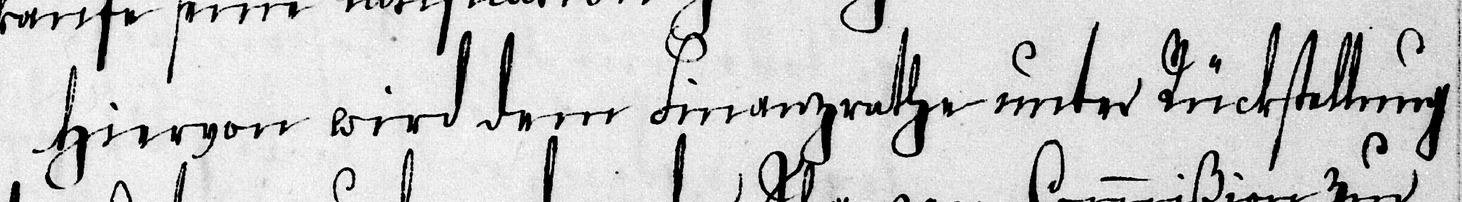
Hiervon wird dem Finanzrathe unter Rückstellung
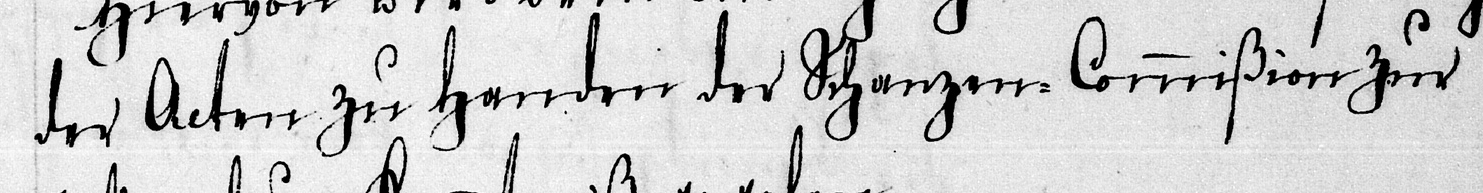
der Acten zu Handen der Schanzen-Commißion zur
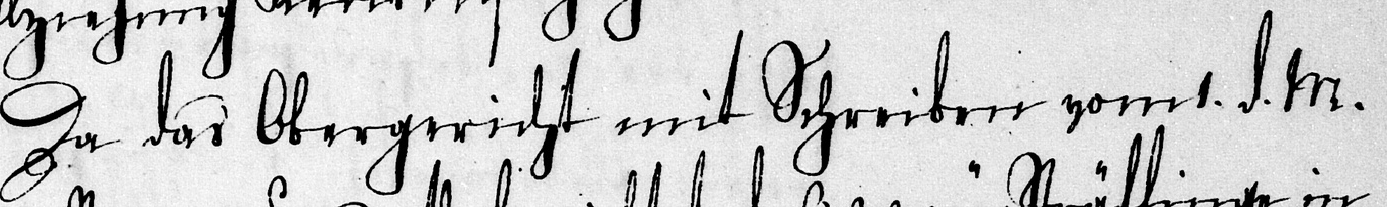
Da das Obergericht mit Schreiben vom 1. d. M.
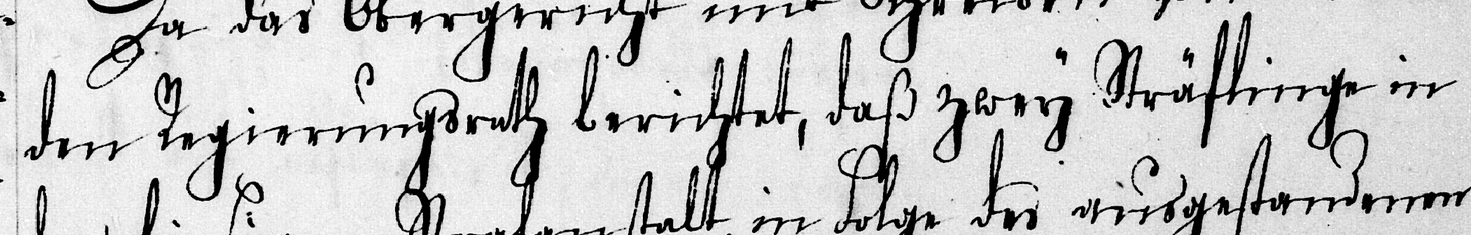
den Regierungsrath berichtet, daß zwey Sträflinge in
